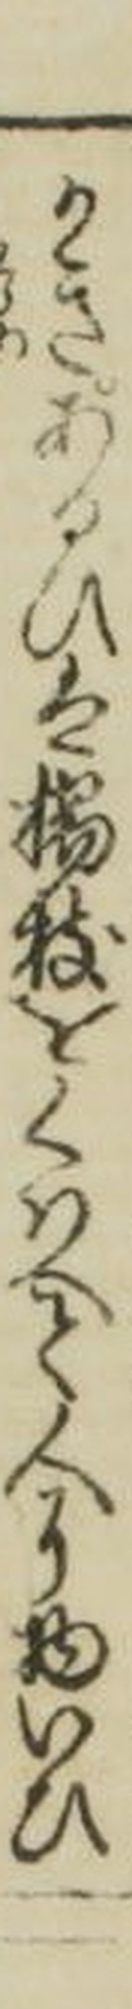かき。あるひは楊枝をくはへて人に物いひ
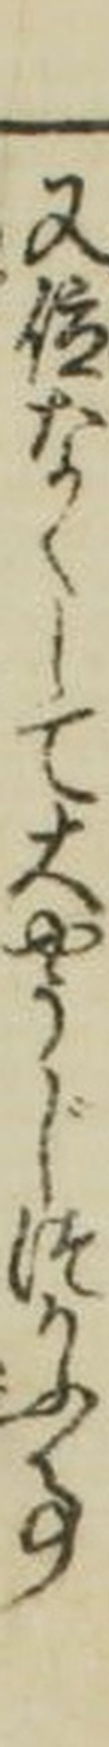又位なくして大やうじつかふ事
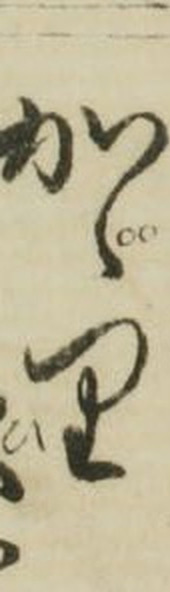かゞり
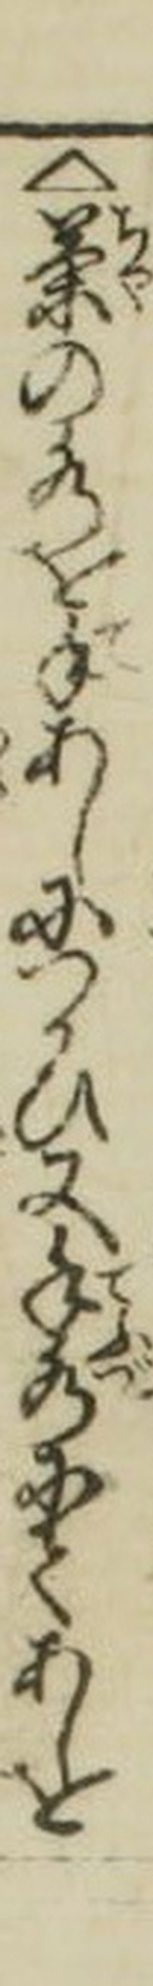△茶の水を手あしにつかひ又手水にてあしを
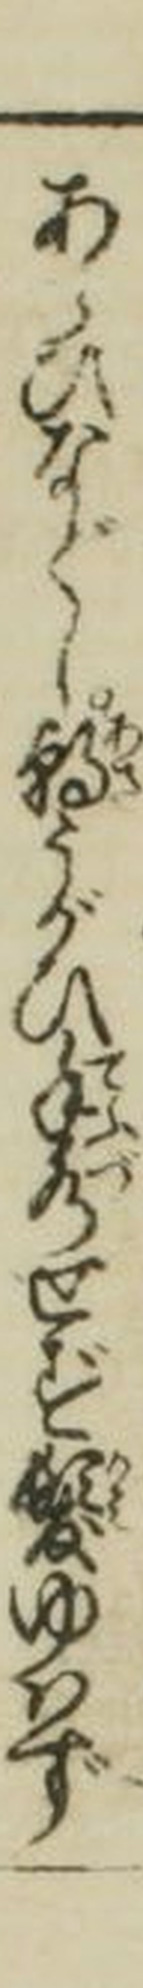あらひなどし。朝うがひ手水せず髪ゆはず
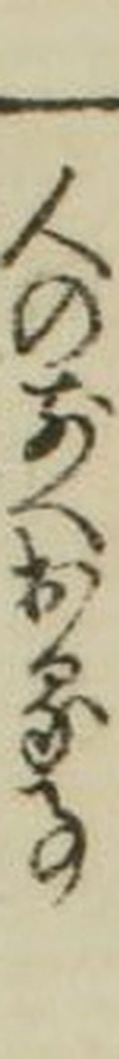人の前へ出る事
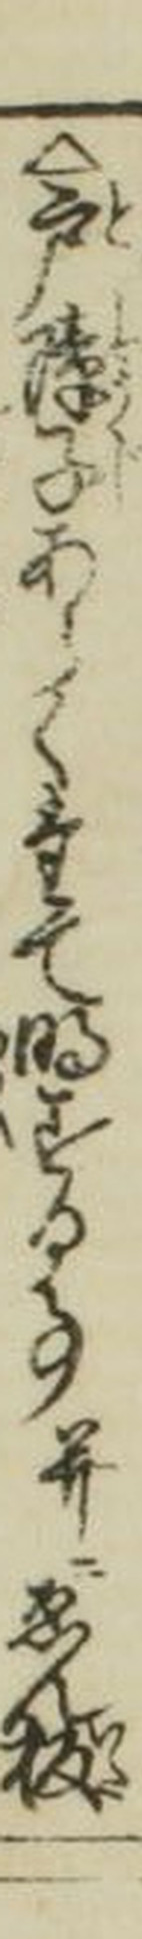△戸障子あらくたて明すること并にゑん板
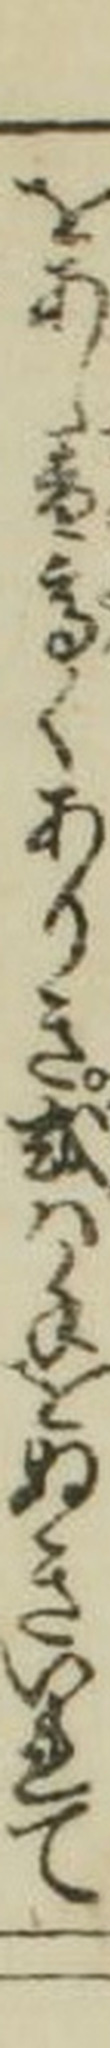をあし音高くありき。或は手をぬきいれて
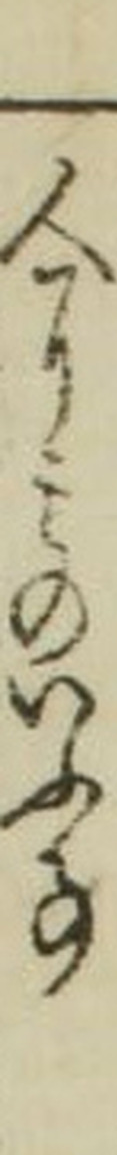人にものいふ事
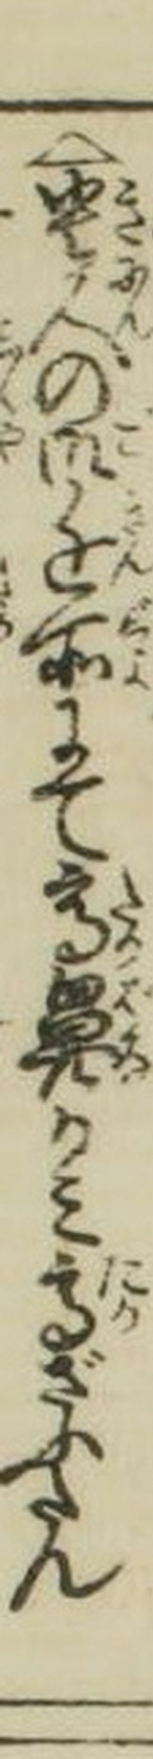△貴人の御近所にて高鼻かみ高ざふたん
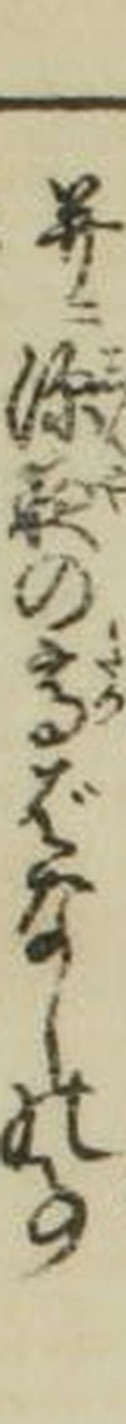并に深夜の高ばなしの事
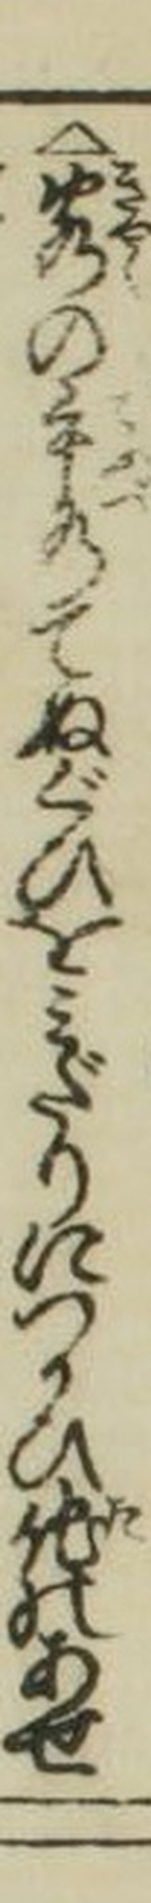△客の手水てぬぐひをみだりにつかひ他のあせ
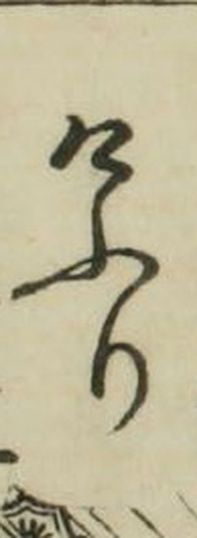けふり
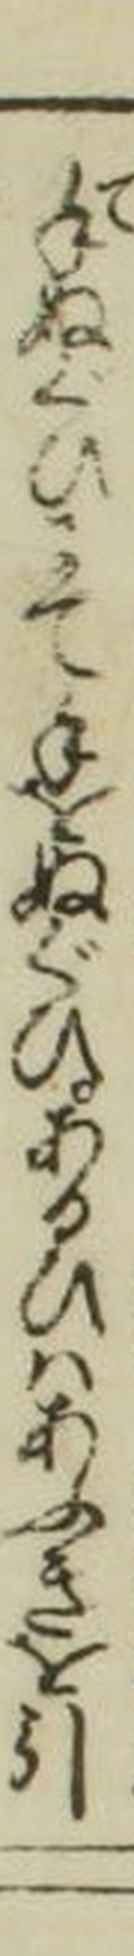手ぬぐひにて手をぬぐひ。あるひはあふきを引
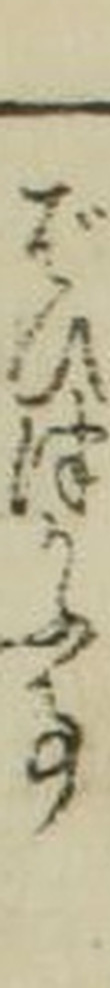ばひつかふ事
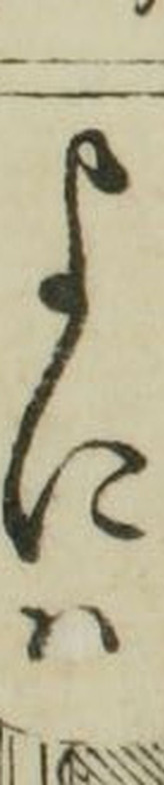よには
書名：女源氏教訓鑑
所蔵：東京学芸大学附属図書館
